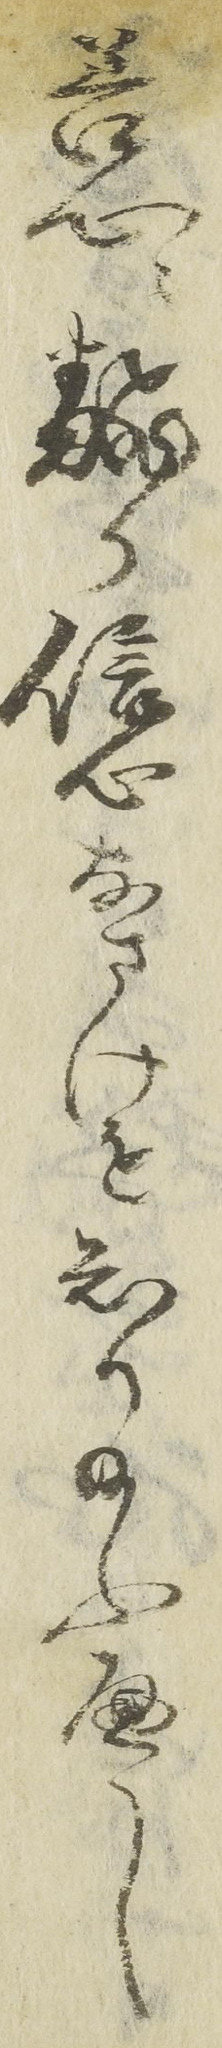善心ニ翻り信心なさけを知り給ふべし
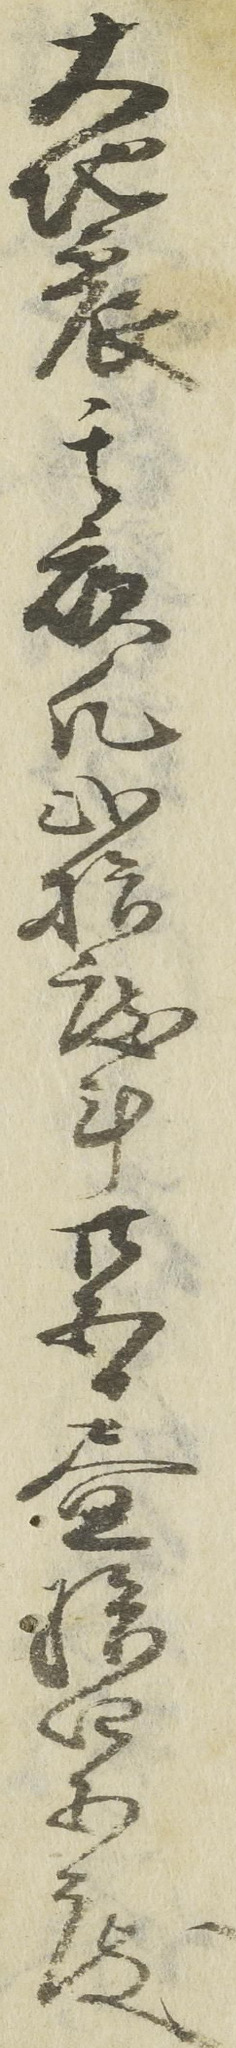大地震其夜凡弐拾度斗廿五日昼拾四五度
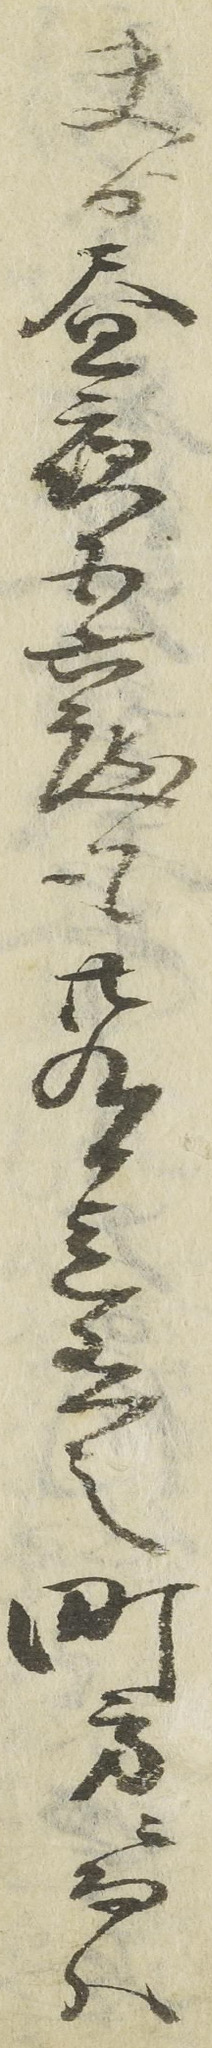夫ゟ昼夜五六度ツ廿九日迄有之町方ニ而ハ
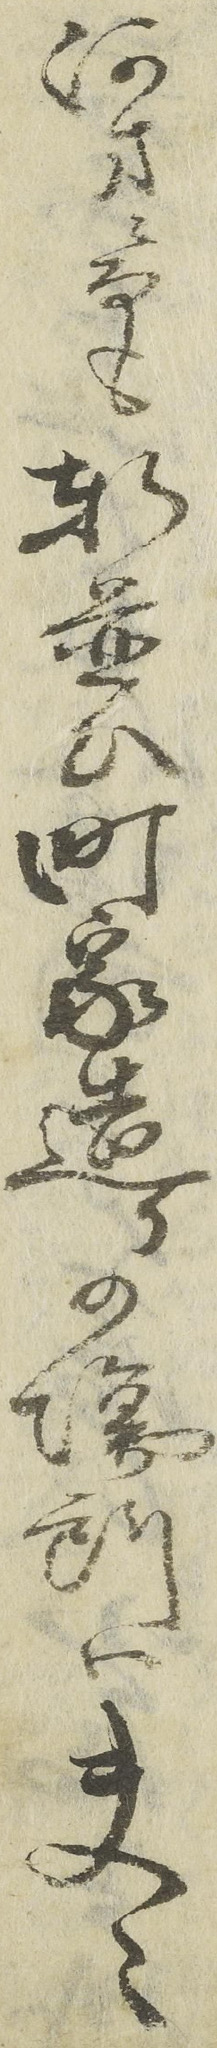何方ニ而も軒並ひ町家造りの場所ハ夫

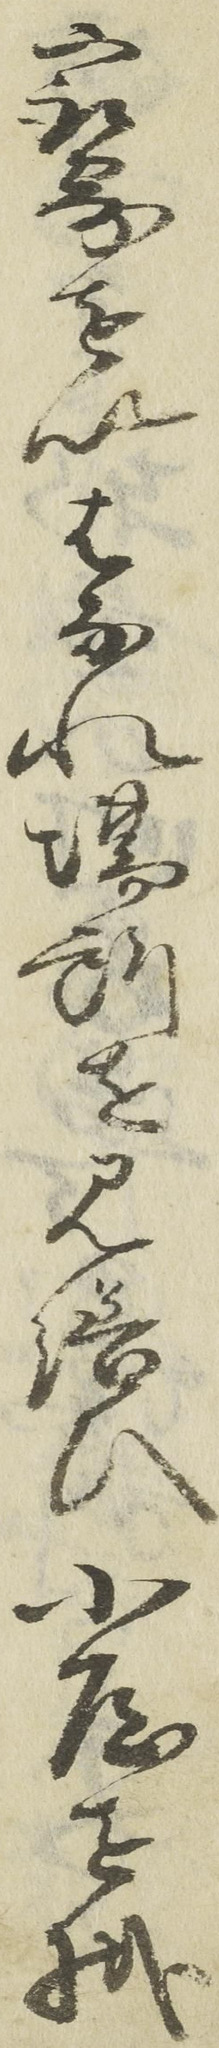最寄を以はなれ場所を見繕ひ小屋を掛
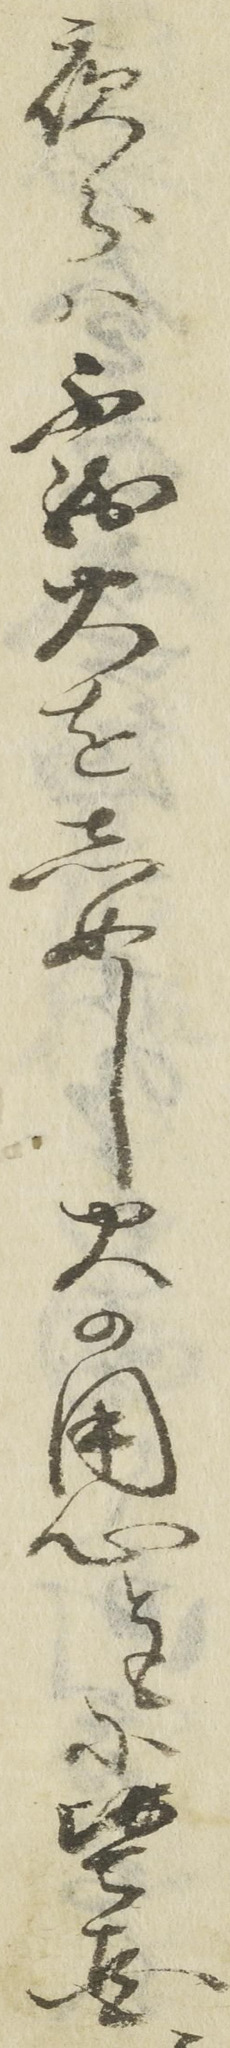夜分ハ不残火をしめし火の用心ともに堅固ニ
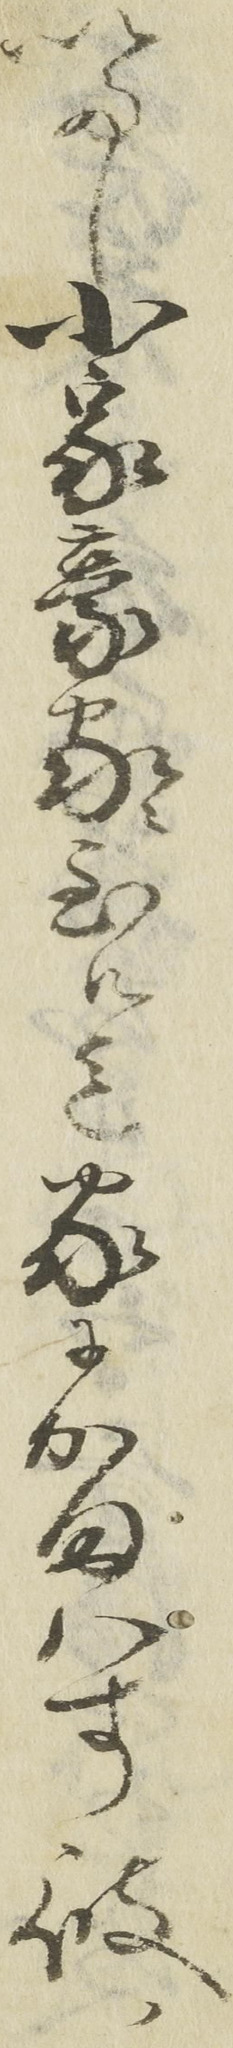いたし小家豪家ニ至ル迄家にかまはす彼ノ
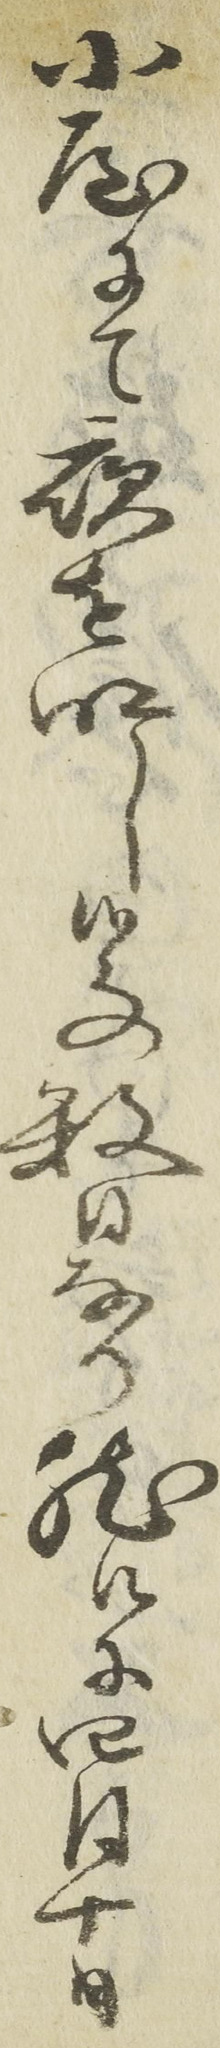小屋にて夜を明し候事数日なり然ルに四月十日
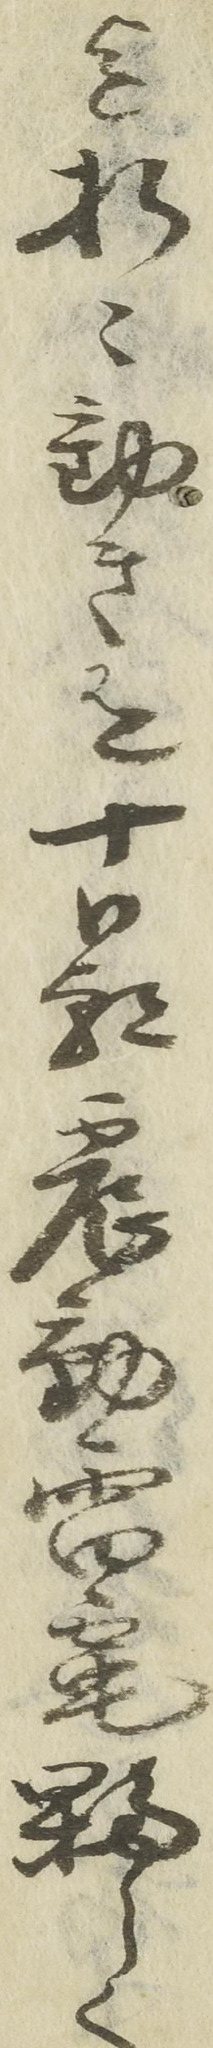迄折々動き有十日朝震動雷電夥しく
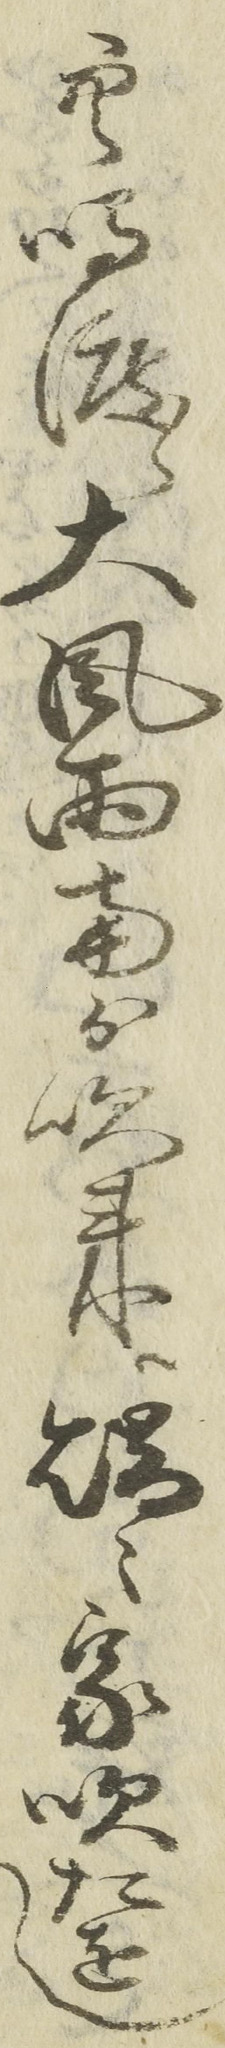空鳴り渡り大風雨南ゟ吹来ル端々家吹たおし
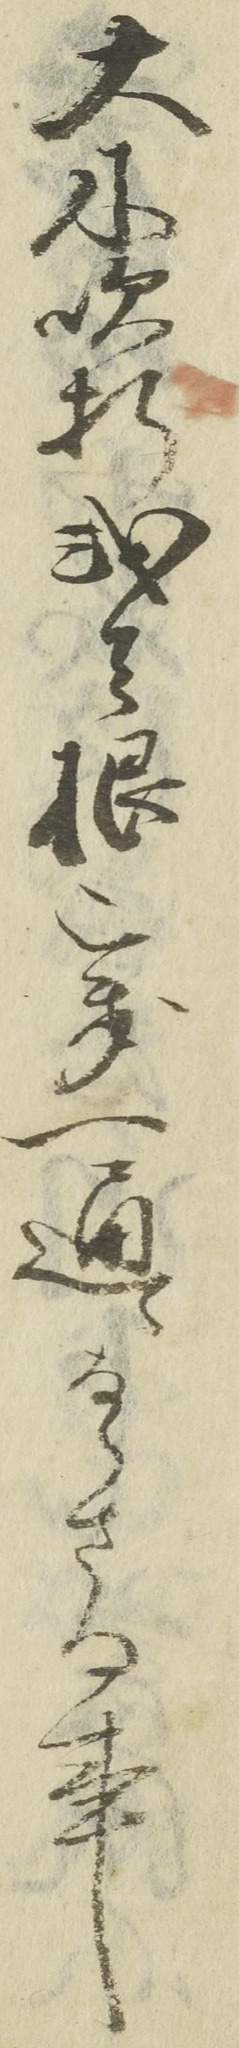大木吹折或は根こき一通りなりさる事
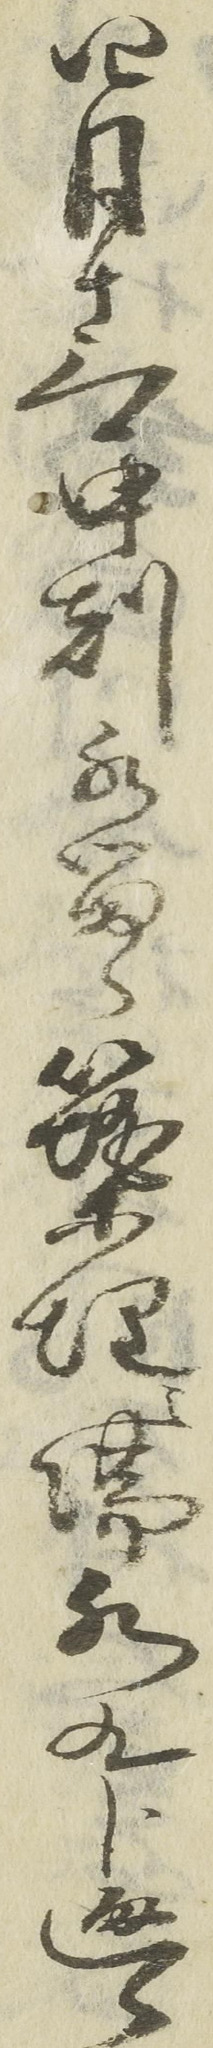四月十三日申刻水留り築埋ミ場水九分通り
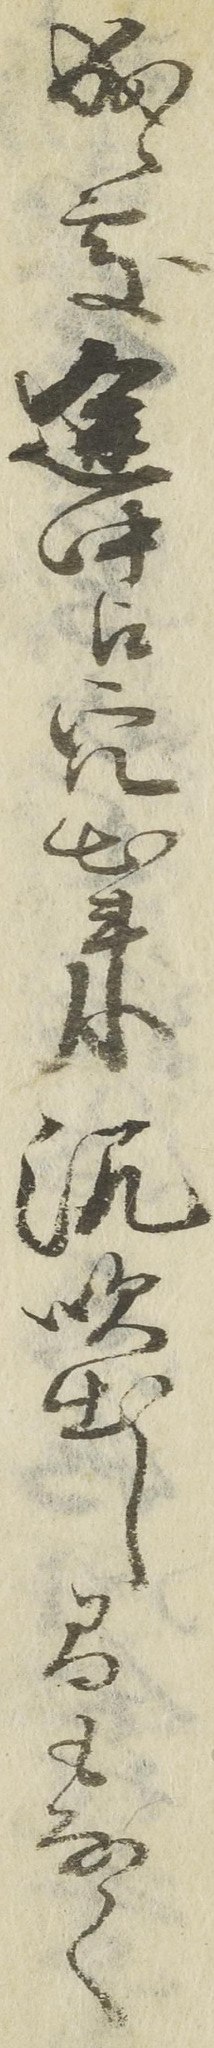成候処途中江穴出来泥吹出し間もなく
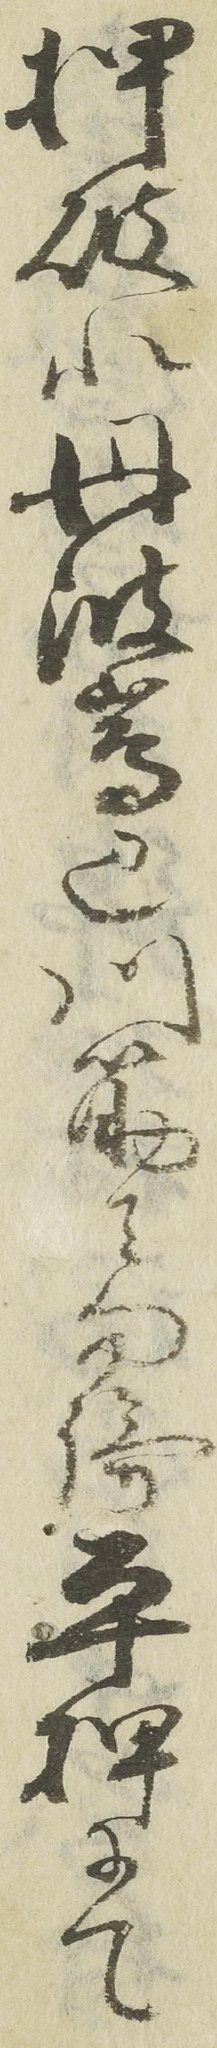押破れ丹波嶋辺川筋は勿論平押にて

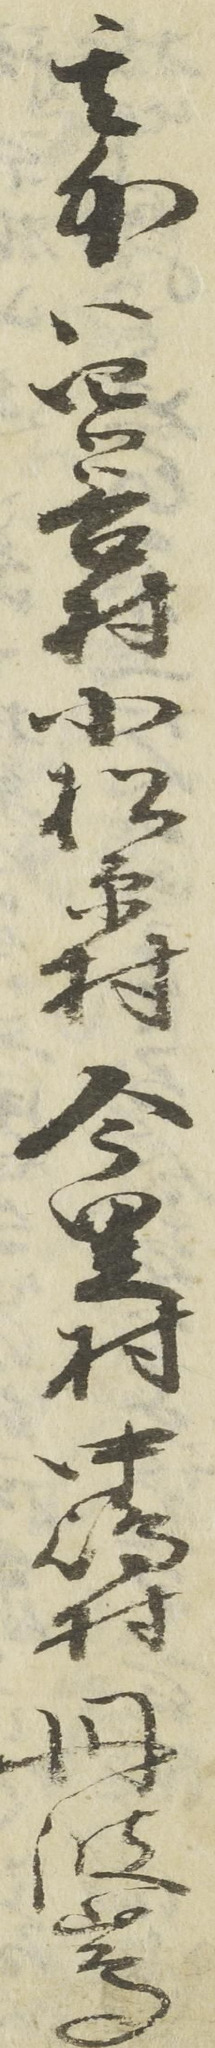其外ハ四ッ谷村小松原村今里村中嶋村丹波嶋
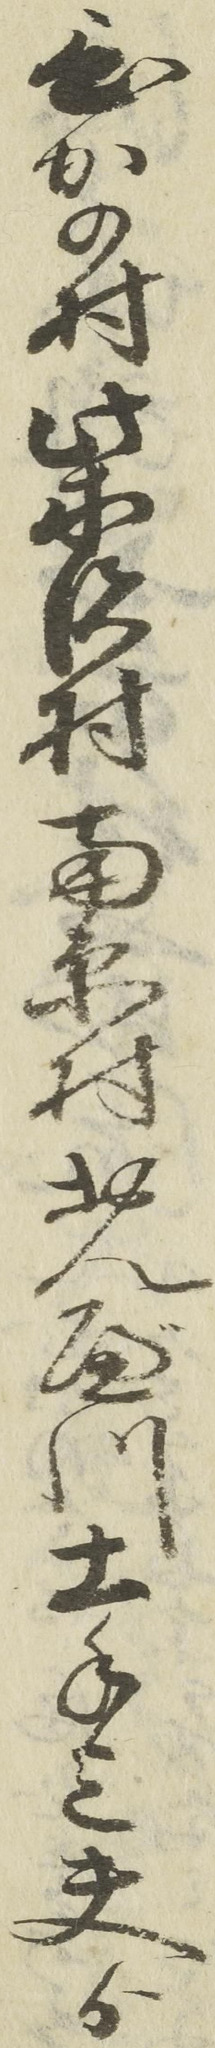ひかの村柴沢村南原村おんべ川土手迄夫ゟ
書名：弘化四　大地震由来　全
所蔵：東京大学地震研究所図書室 Earthquake Research Institute Library, The University of Tokyo, JAPAN
